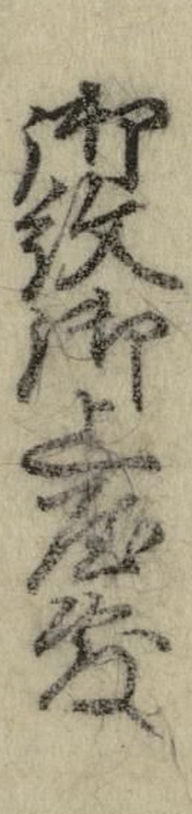御役御上屋敷
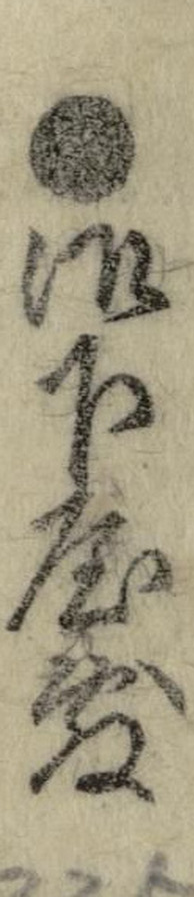●御下屋敷
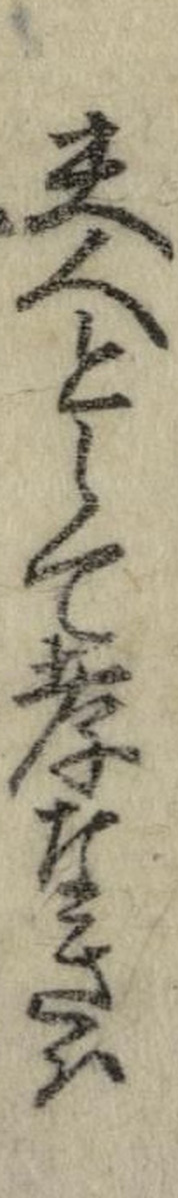夫人として孝なきは
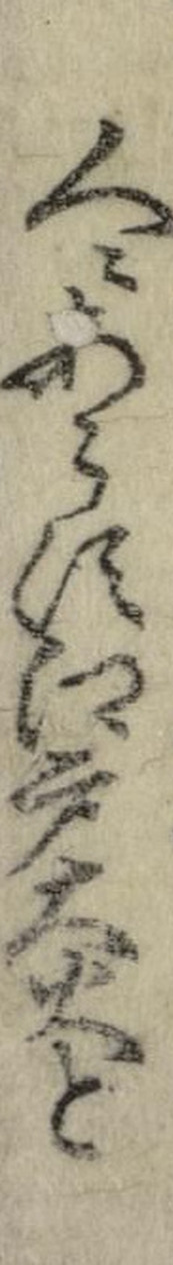人にあらず江戸大火と
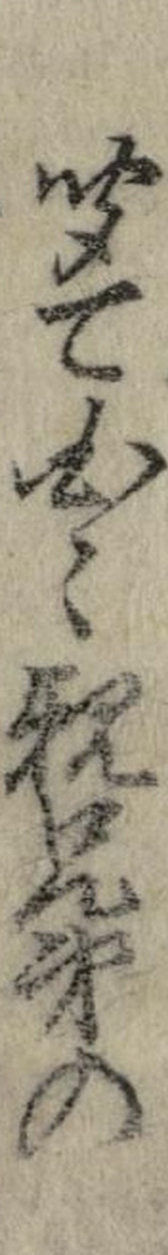聞て国々親兄弟の
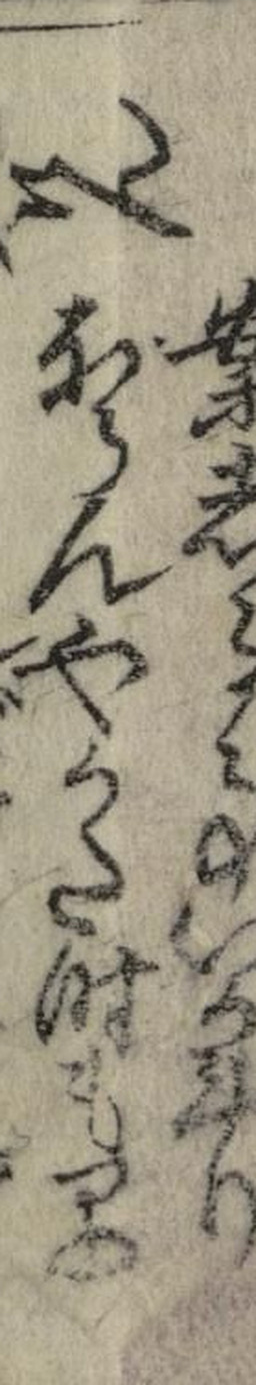ならんやかた時も早
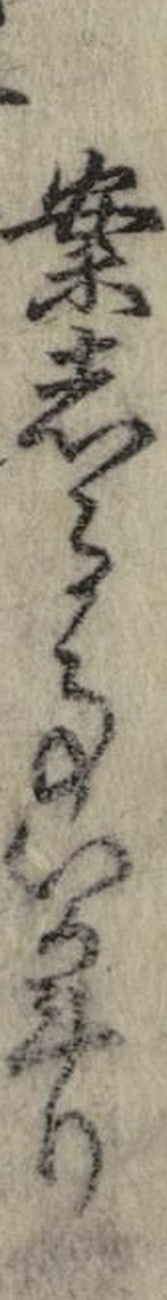案しる事いか斗り
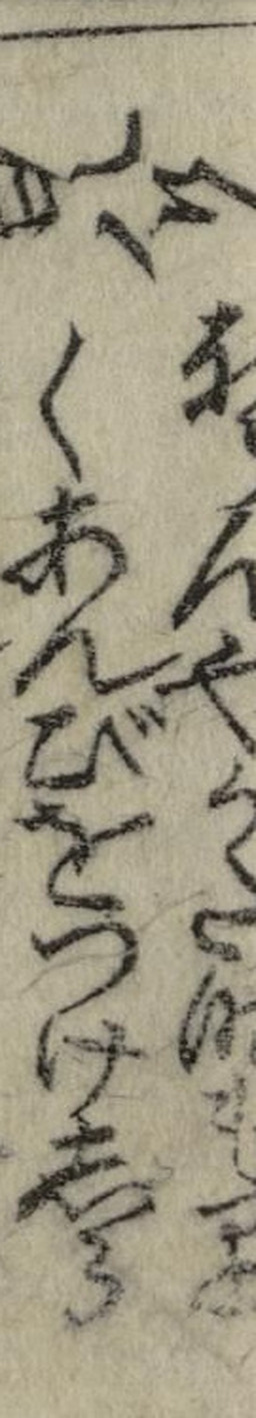くあんびをつけしら
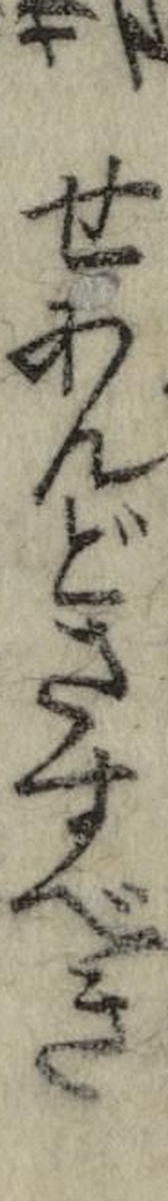せあんどさすべき
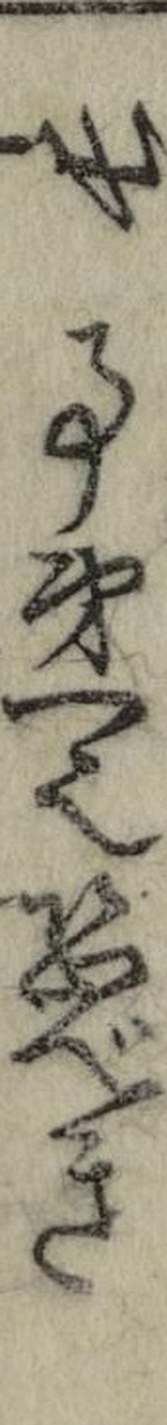事第一也恐べき
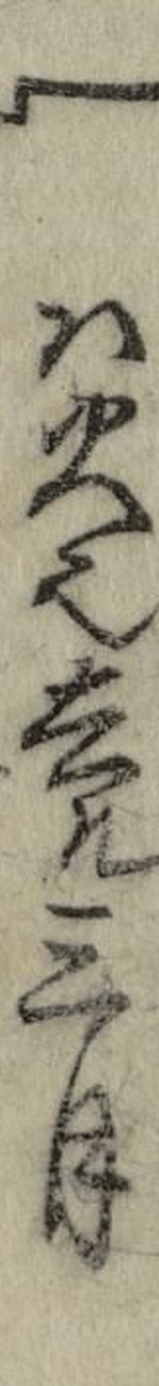は火也去三月
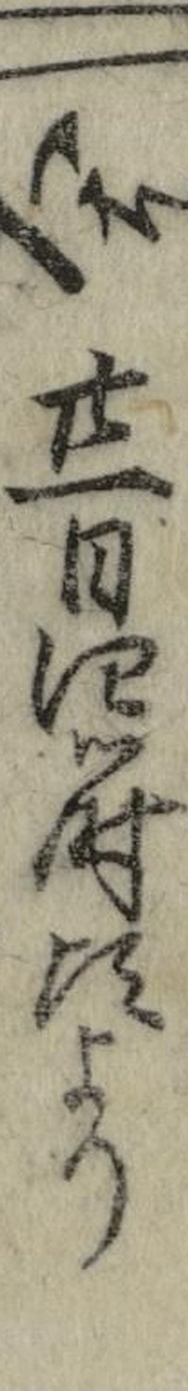廿一日四ッ時頃より
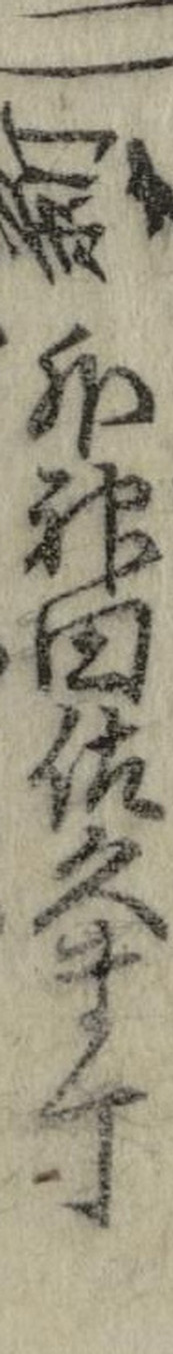外神田佐久間丁
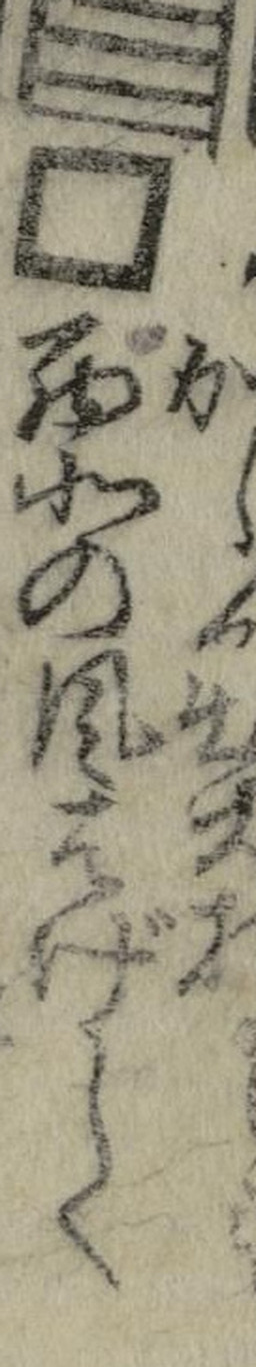西北の風はげしく
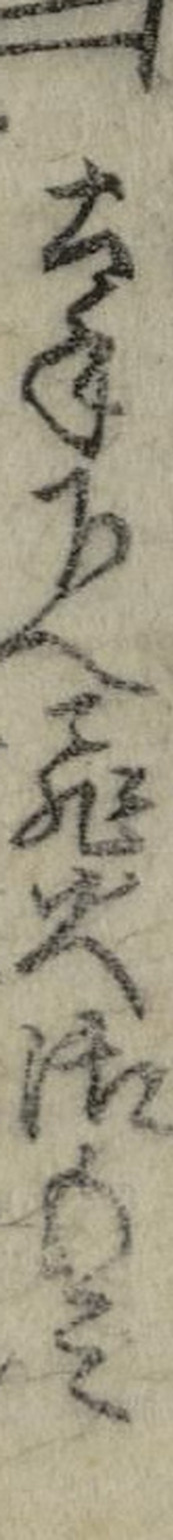土手下へ飛火御もみ
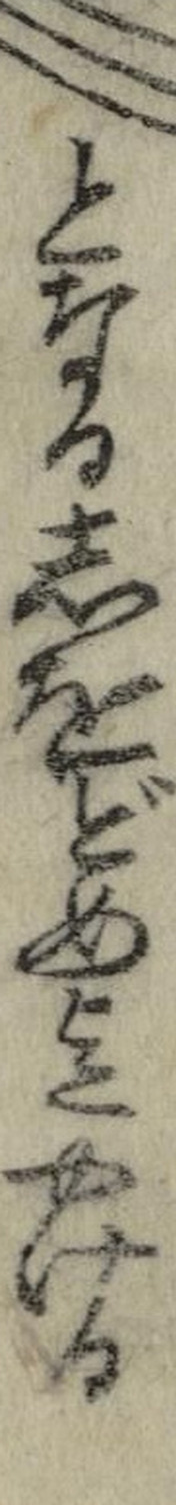となるしおどめ迄やける
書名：[文政十二年三月の江戸大火に関する瓦版]
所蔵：東京大学地震研究所図書室 Earthquake Research Institute Library, The University of Tokyo, JAPAN
